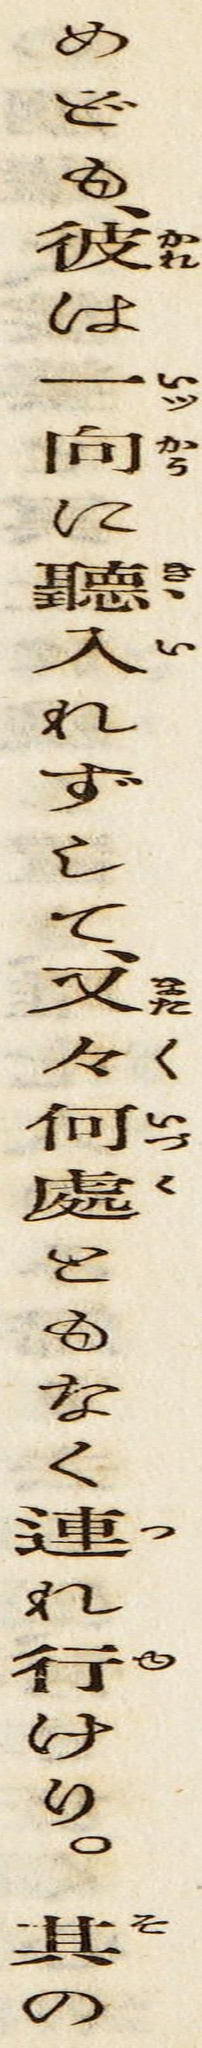めども、彼は一向に聴入れずして、又々何処ともなく連れ行けり。其の
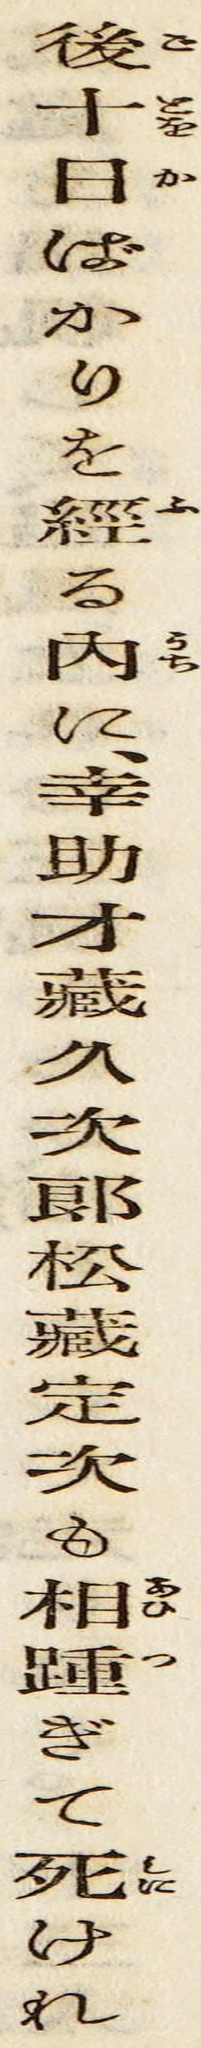後十日ばかりを経る内に、幸助才蔵久次郎松蔵定次も相踵ぎて死けれ
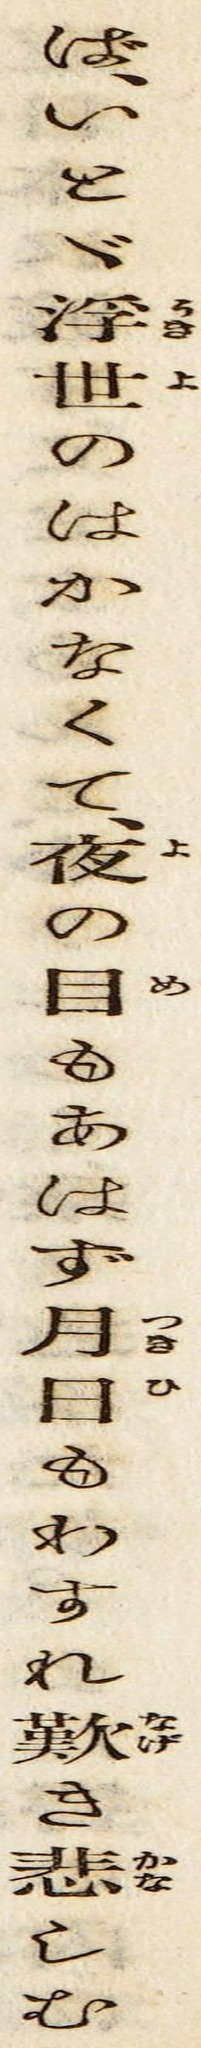ば、いとヾ浮世のはかなくて、夜の目もあはず月日もわすれ歎き悲しむ
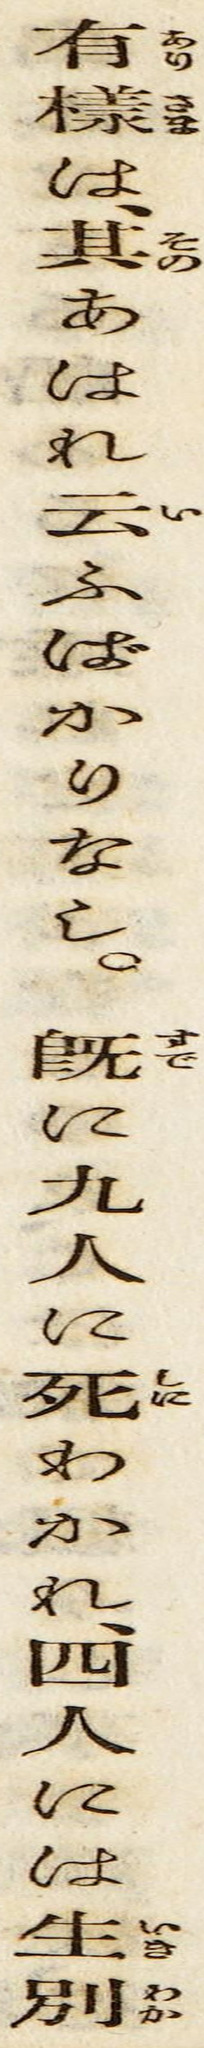有様は、其あはれ云ふばかりなし。既に九人に死わかれ、四人には生別
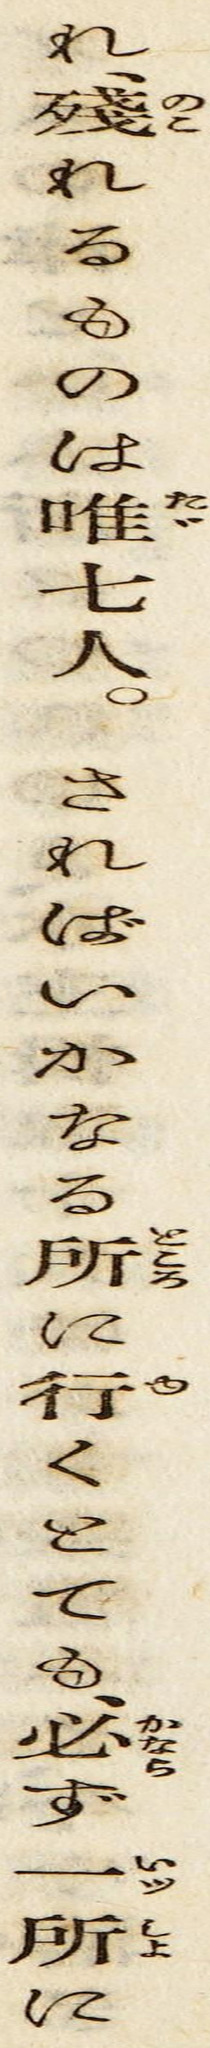れ、残れるものは唯七人。さればいかなる所に行くとても、必ず一所に
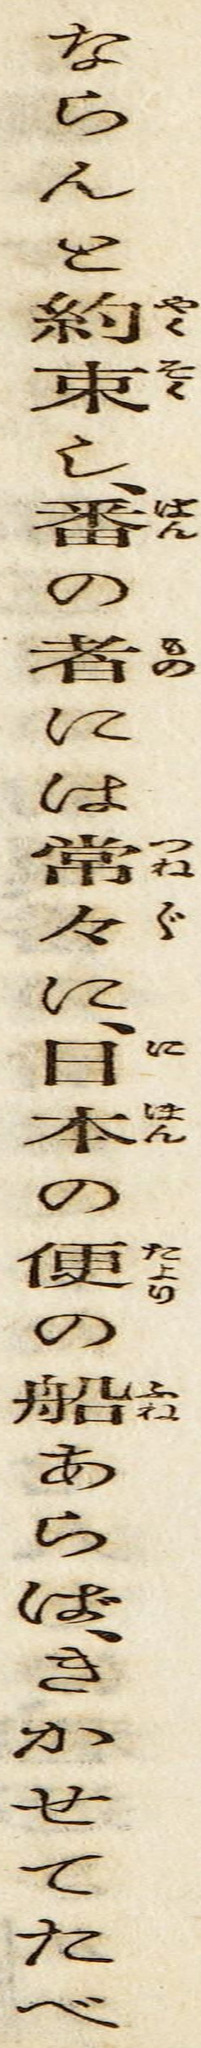ならんと約束し、番の者には常々に、日本の便の船あらば、きかせてたべ

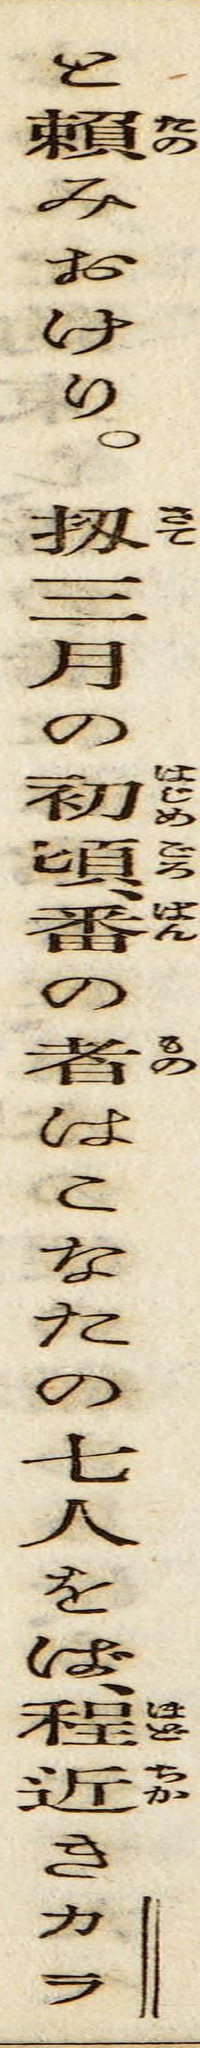と頼みおけり。扨三月の初頃、番の者はこなたの七人をば、程近きカラ
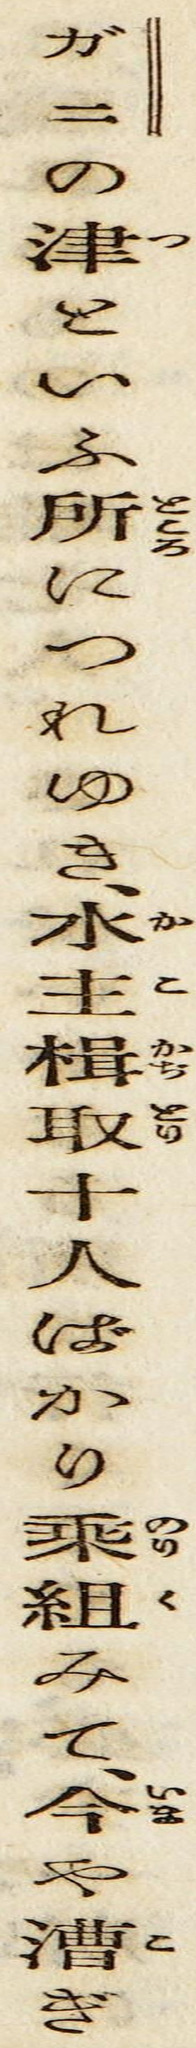ガニの津といふ所につれゆき、水主楫取十人ばかり乗組みて、今や漕ぎ
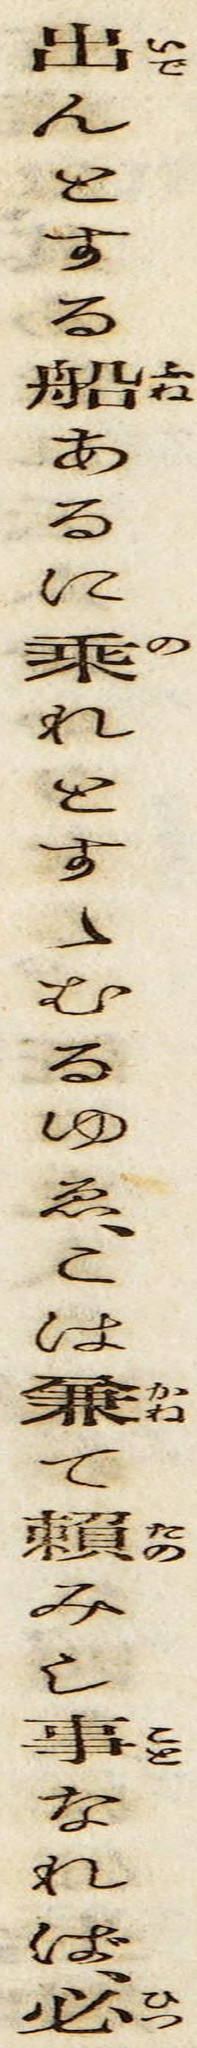出んとする船あるに乗れとすゝむるゆゑ、こは兼て頼みし事なれば、必
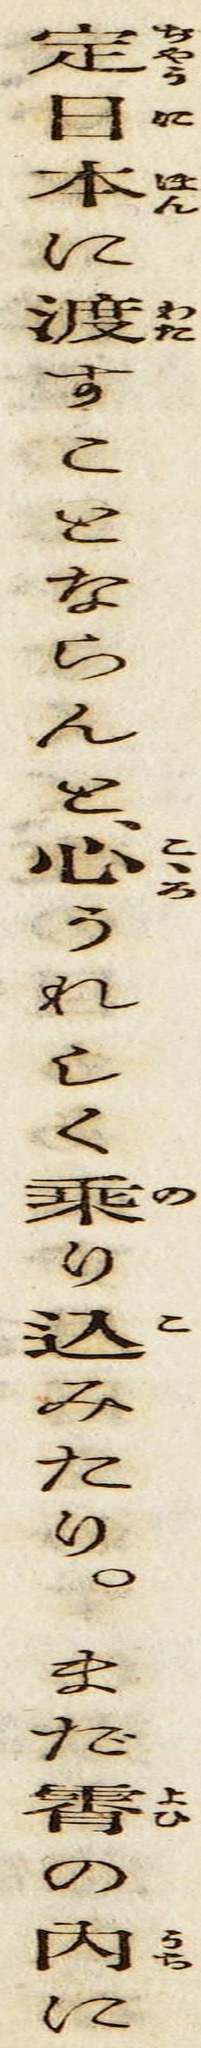定日本に渡すことならんと、心うれしく乗り込みたり。また霄の内に
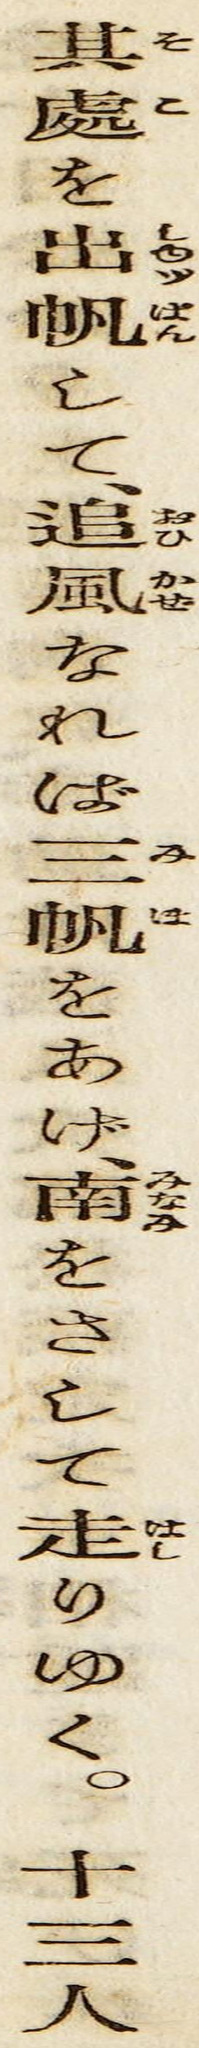其処を出帆して、追風なれば三帆をあげ、南をさして走りゆく。十三人
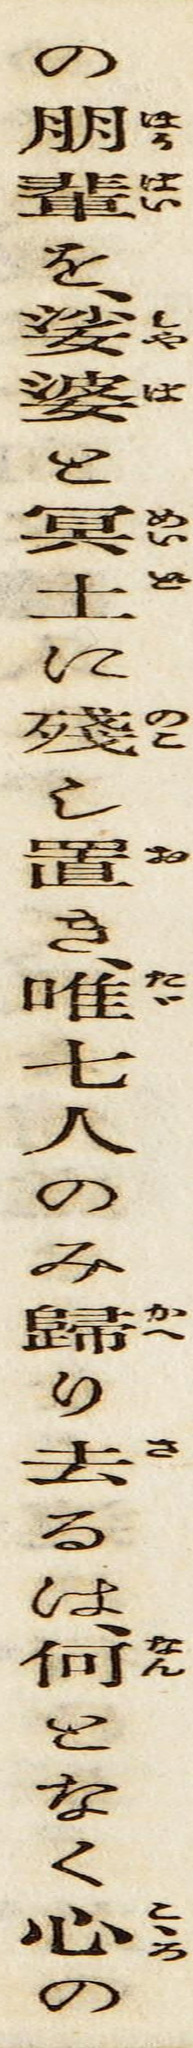の朋輩を、娑婆と冥土に残し置き、唯七人のみ帰り去るは、何となく心の
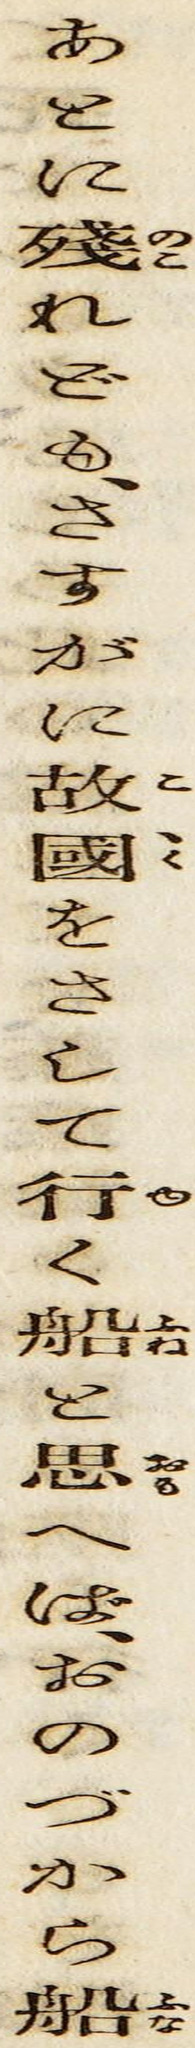あとに残れども、さすがに故国をさして行く船と思へば、おのづから船
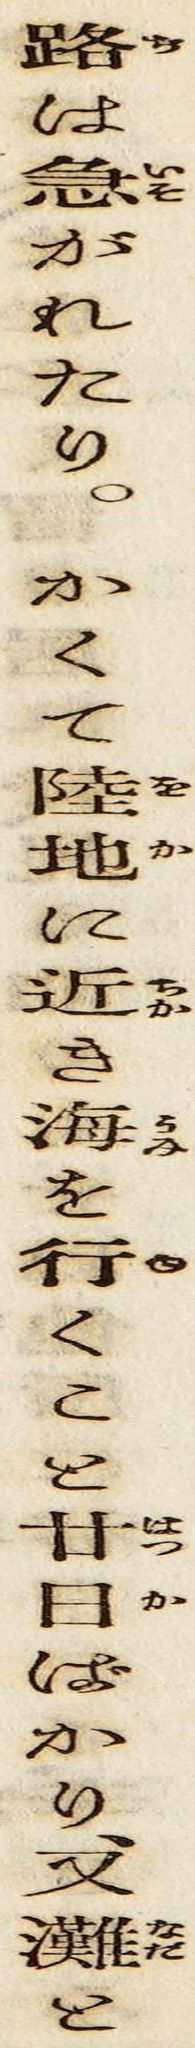路は急がれたり。かくて陸地に近き海を行くこと廿日ばかり、又灘と
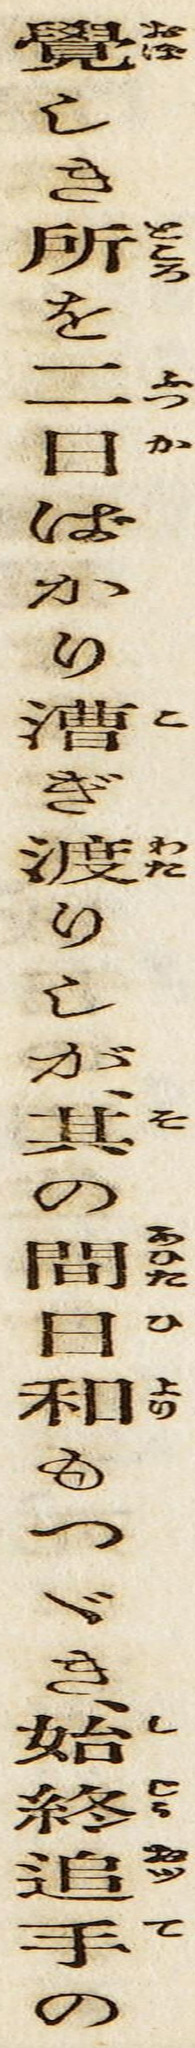覚しき所を二日ばかり漕ぎ渡りしが、其の間日和もつヾき、始終追手の
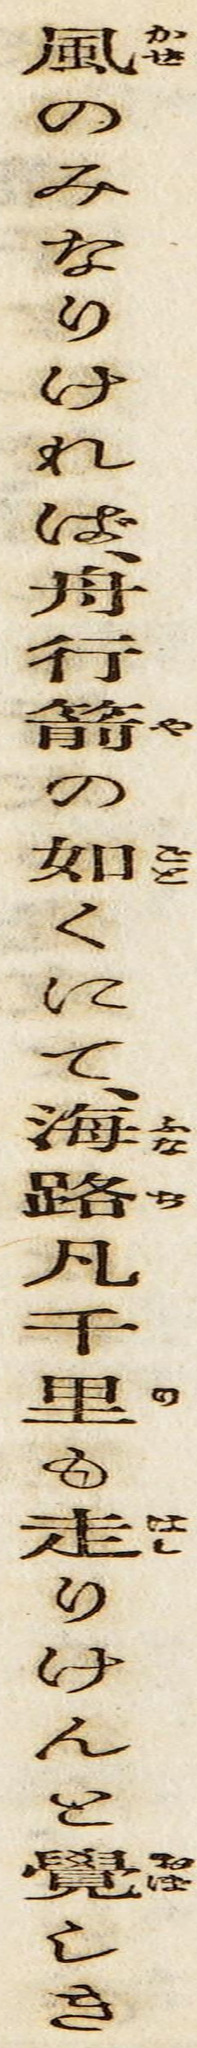風のみなりければ、舟行箭の如くにて、海路凡千里も走りけんと覚しき
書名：日本漂流譚
